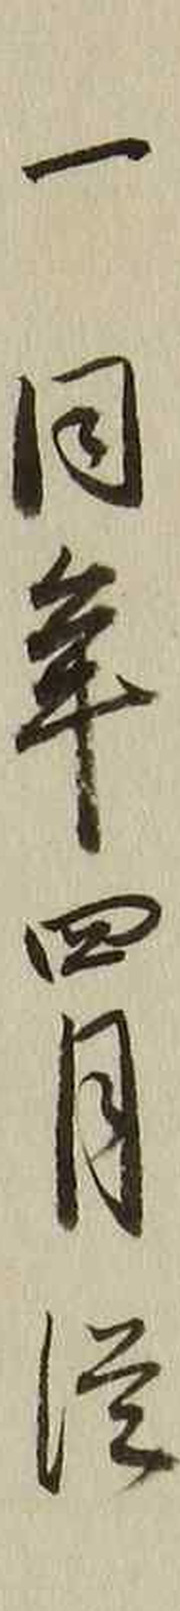一同年四月従
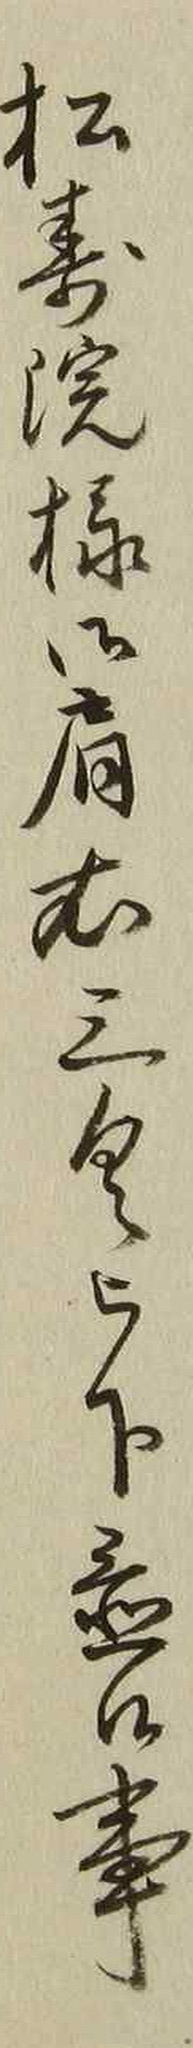松寿院様御肩衣三具被下置候事
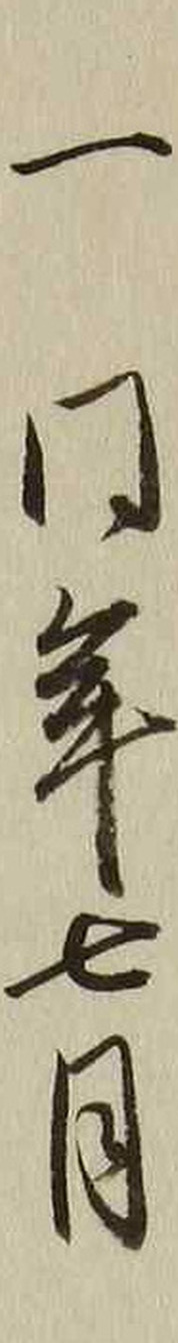一同年二月
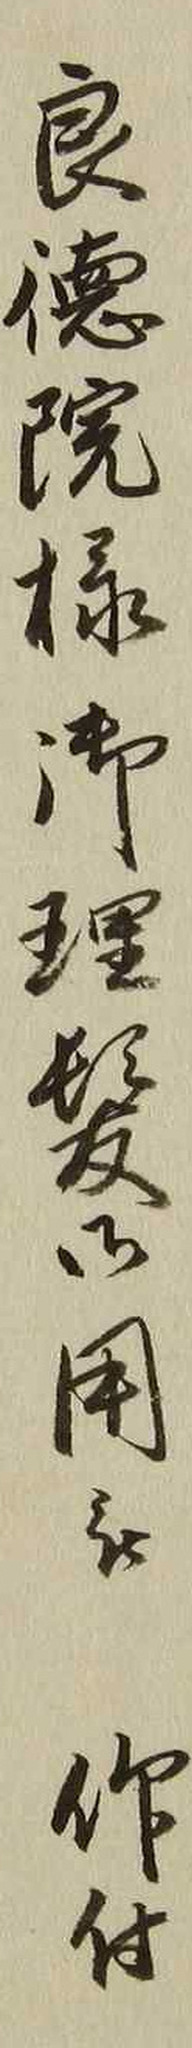良徳院様御理髪御用被仰付
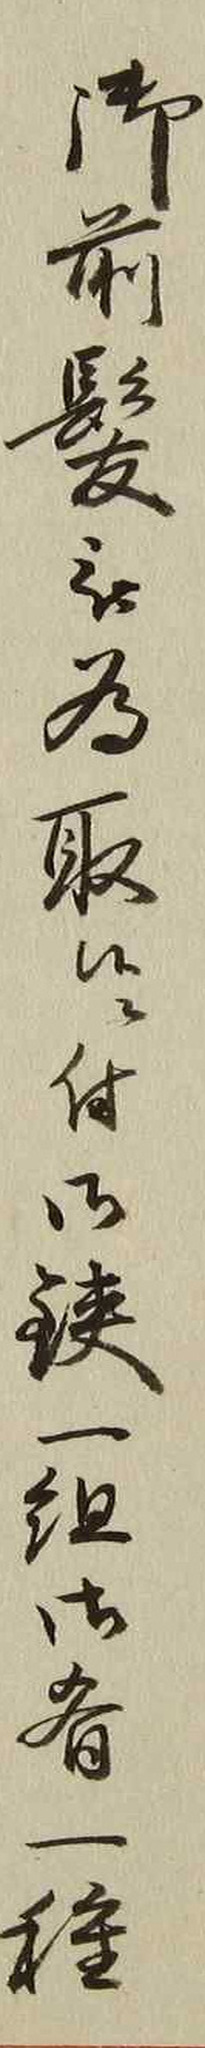御前髪被為取候に付御挟一組御肴一種
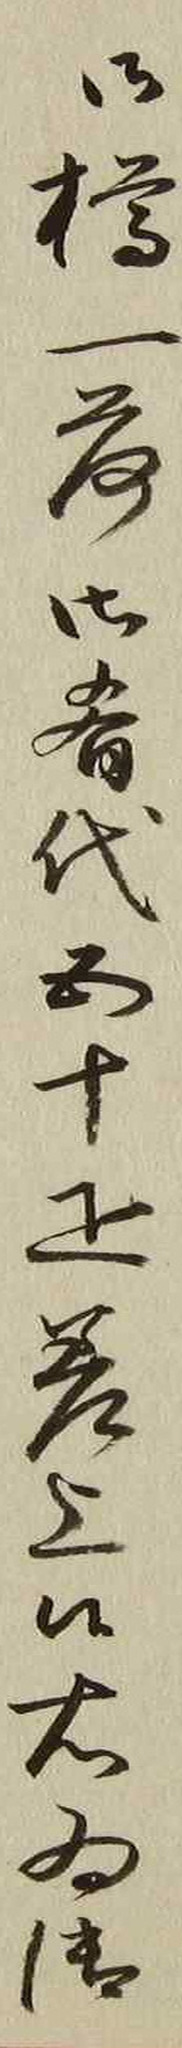御樽一荷御肴代五十疋差上候右為御
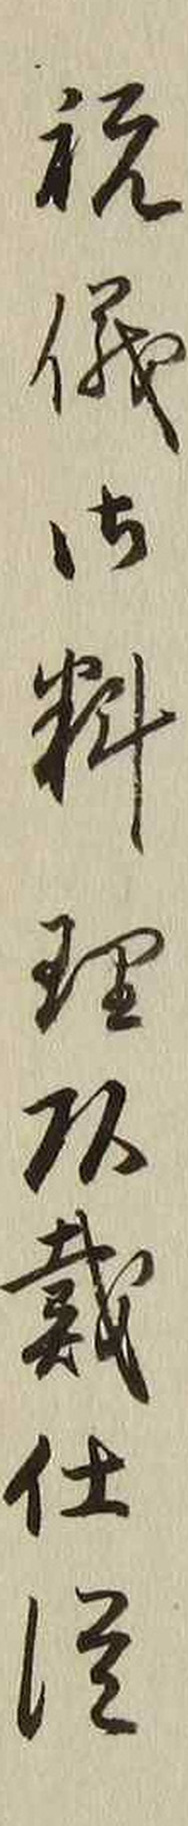祝儀御料理頂戴仕従
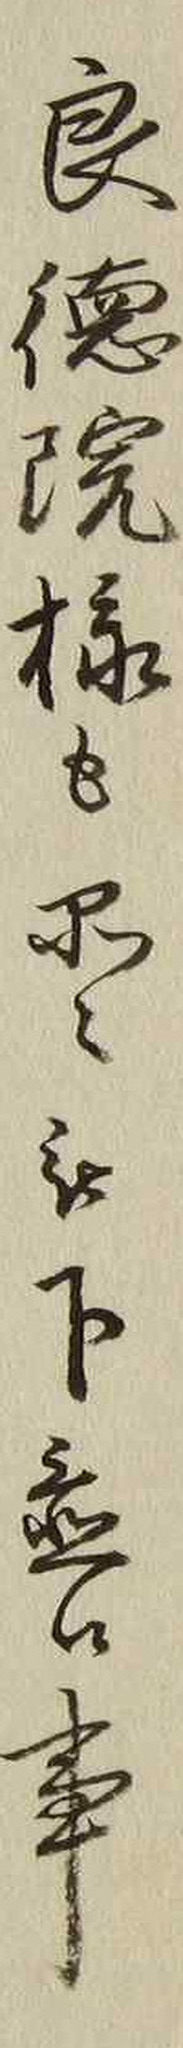良徳院様も品々被下置候事
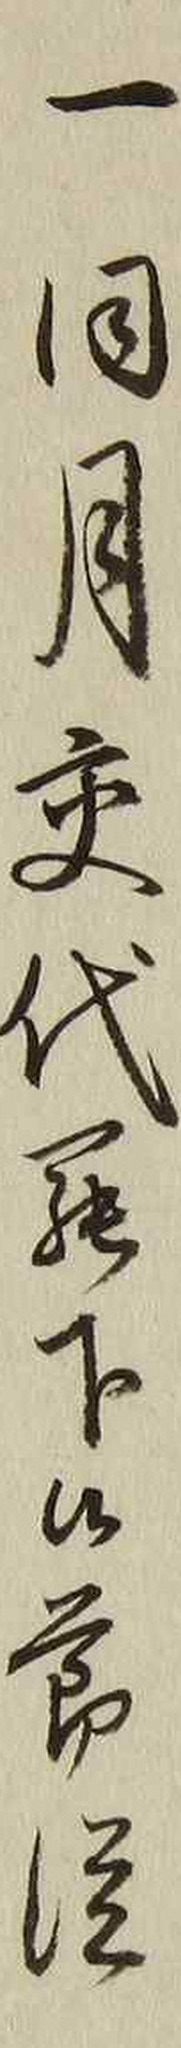一同月交代罷下候節従
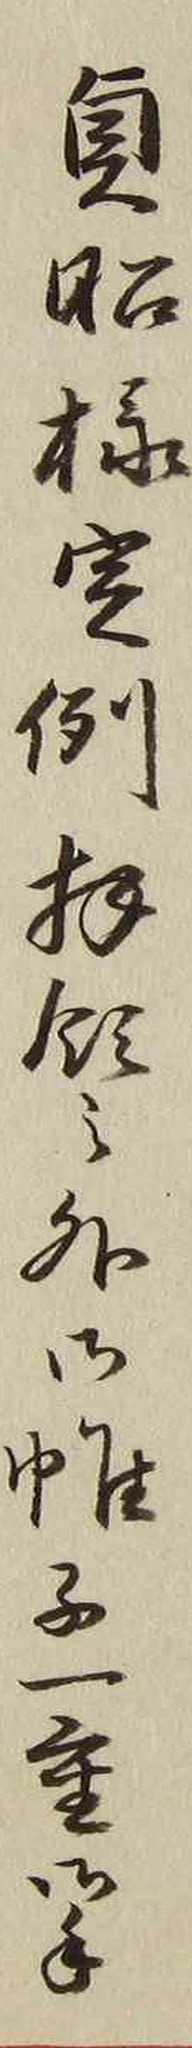貞昭様定例定例拝領之外御帷子一重御手
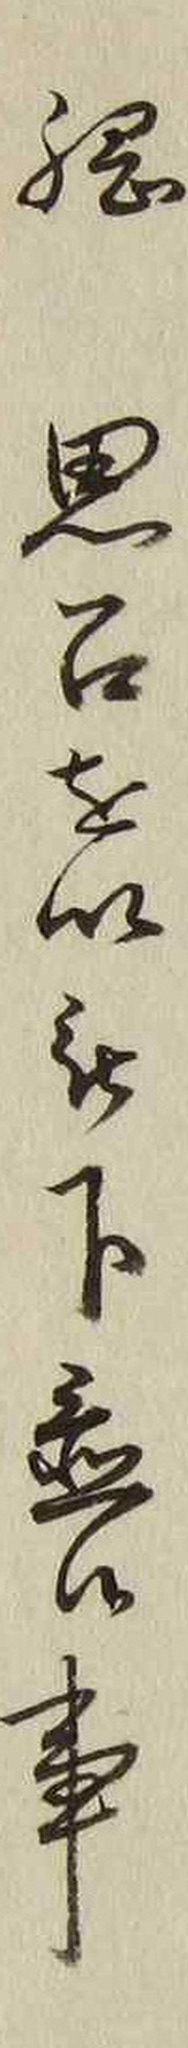綱思召を以被下置候事
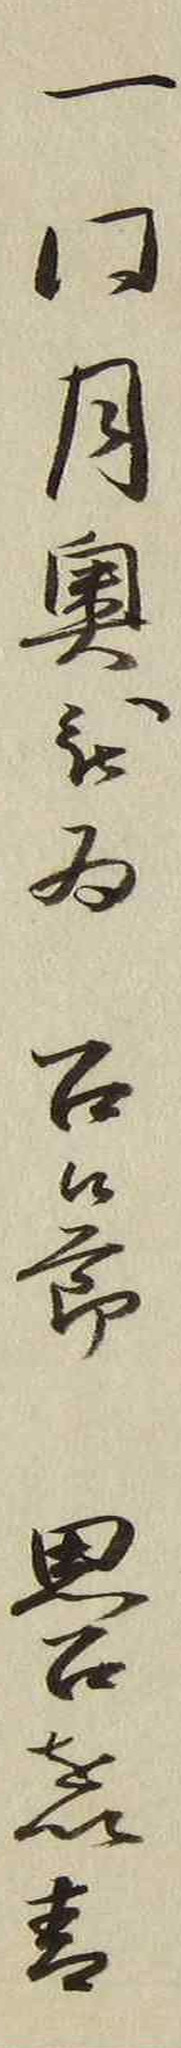一同月奥へ被為召候節思召を以青
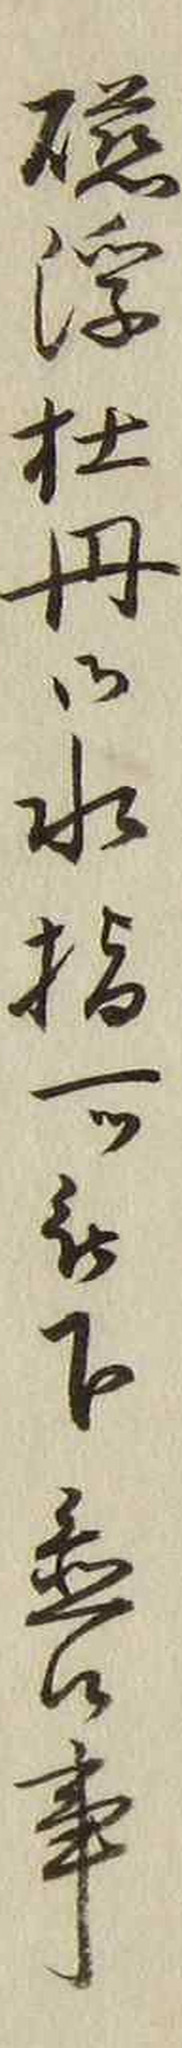磁浮牡丹御水指一つ被下置候事
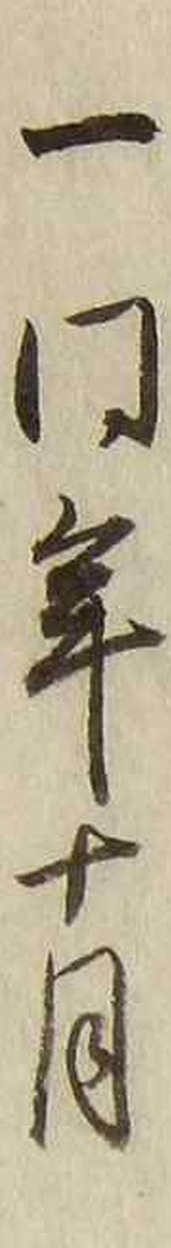一同年十月

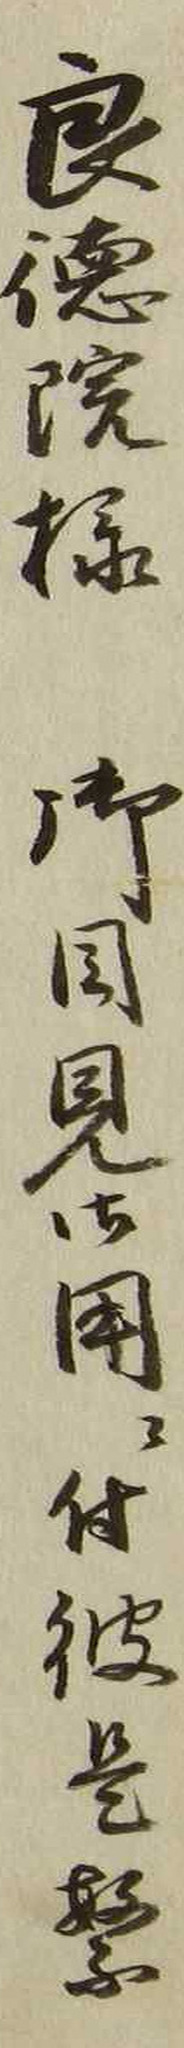良徳院様御目見御用に付彼是繁
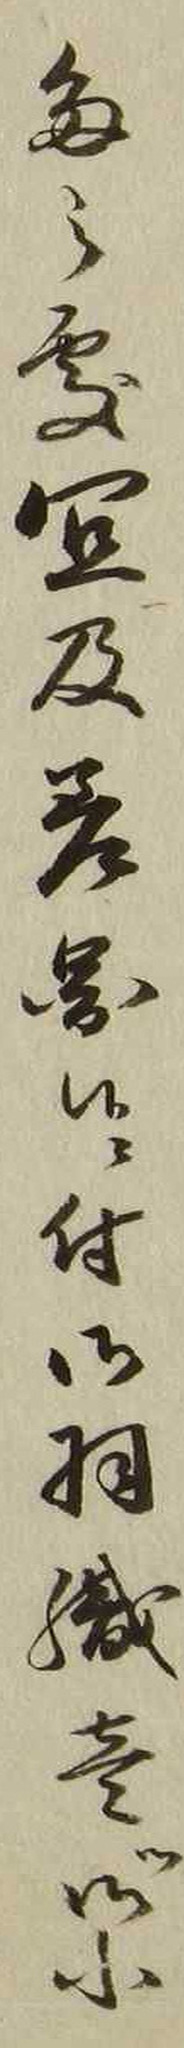多之処宜及指図候に付御羽織壱つ御小
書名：諸士系譜　巻之125　た之部1
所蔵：会津若松市立会津図書館
